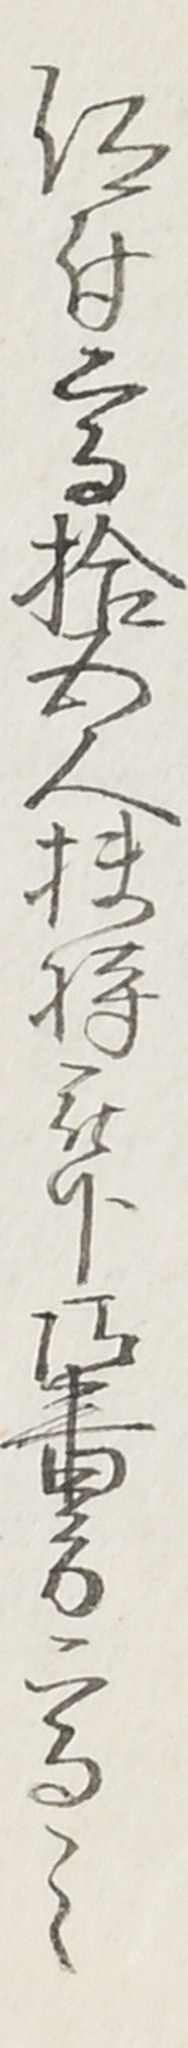仰付高拾五人扶持被下御番方高之
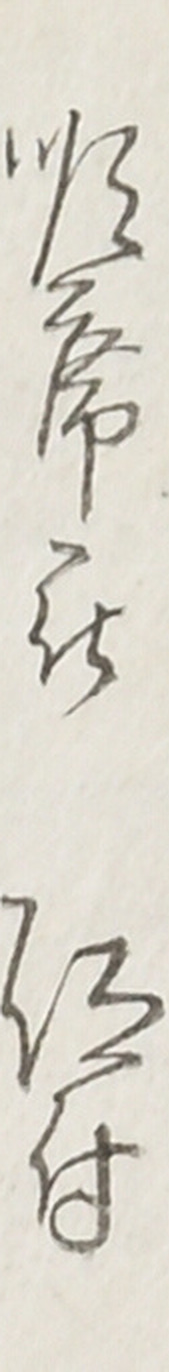順席被仰付
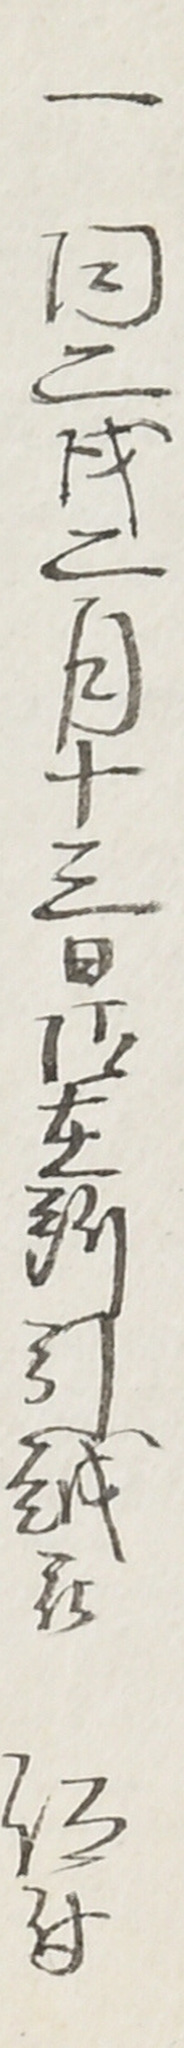一同二戌二月十三日御在所引越被仰付
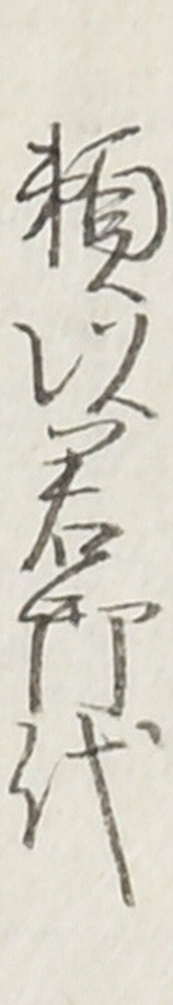頼以君御代
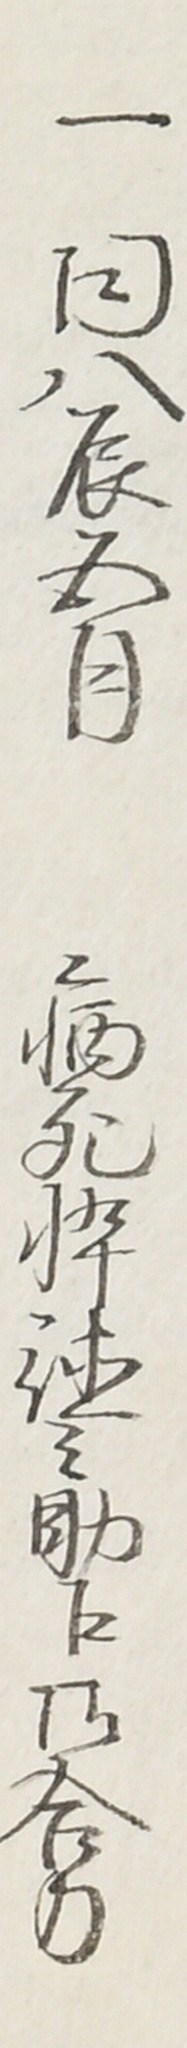一同八辰五月病死忰徳之助江御合力
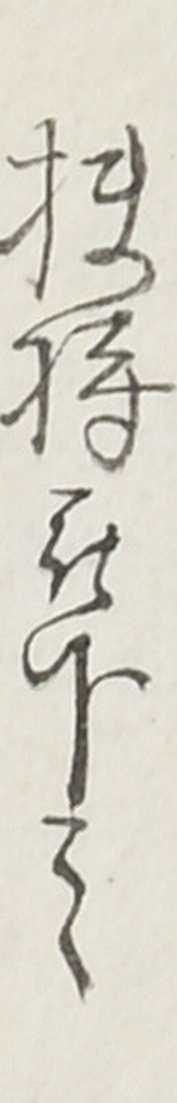扶持被下之

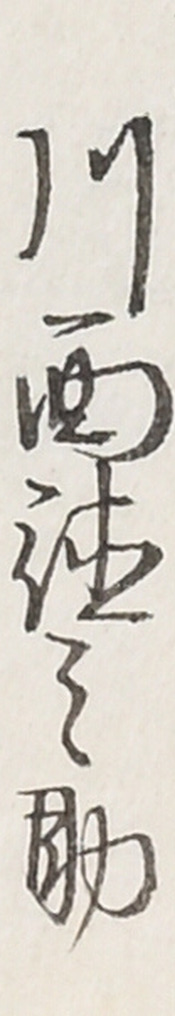川西徳之助
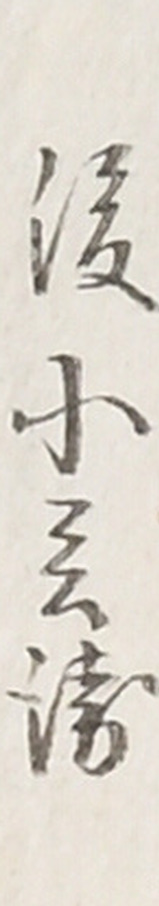後小兵衛
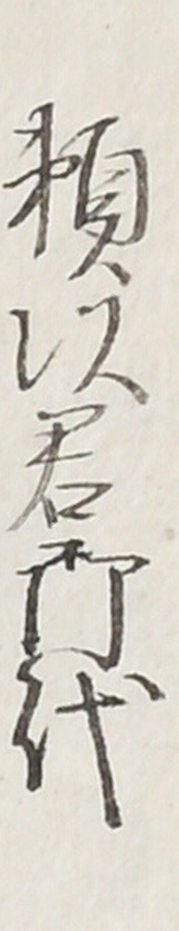頼以君御代
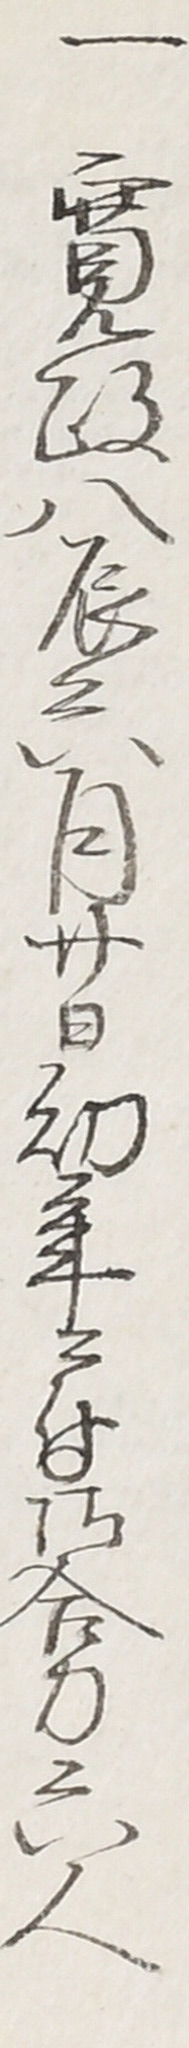一寛政八辰六月廿日幼年ニ付御合力六人
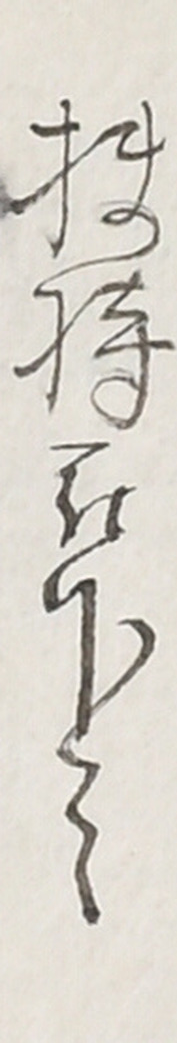扶持被下之
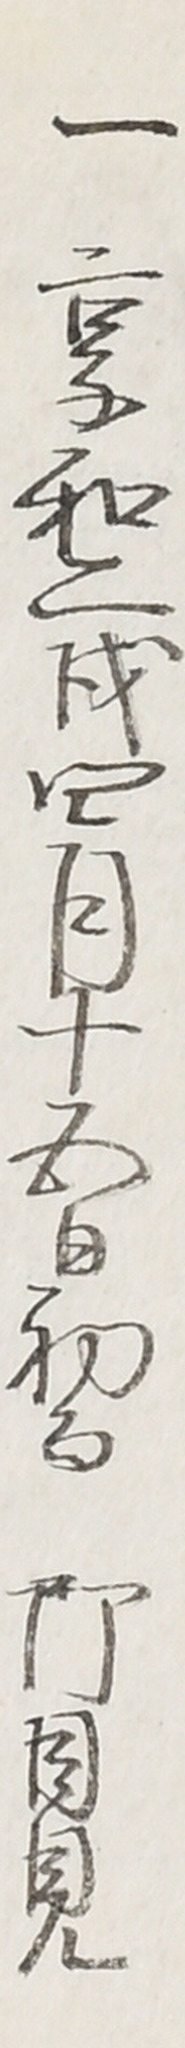一享和二戌四月十五日初而御目見
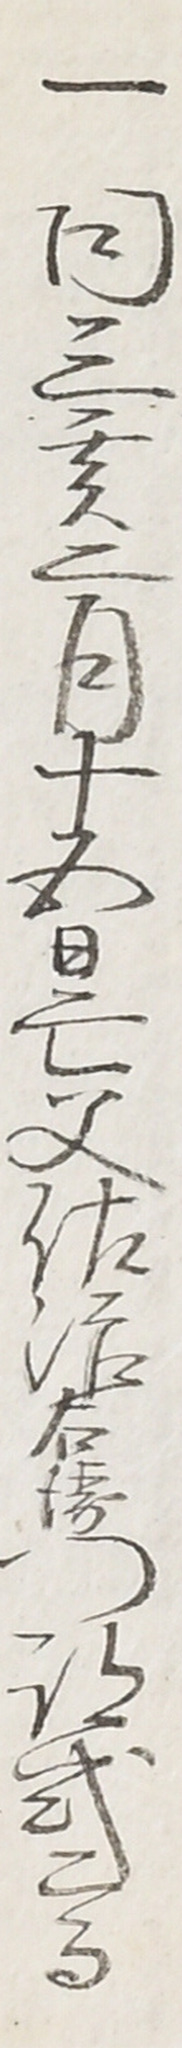一同三亥二月十五日亡父佐治右衛門跡式高
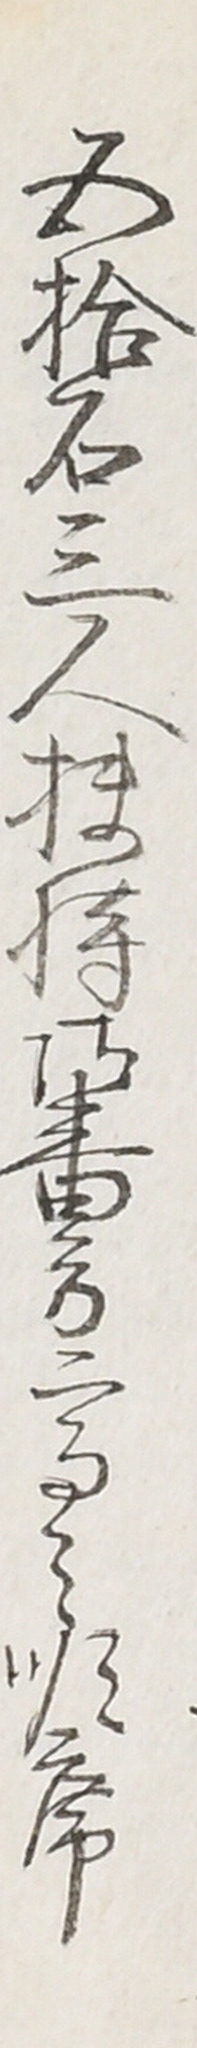五拾石三人扶持御番方高之順席
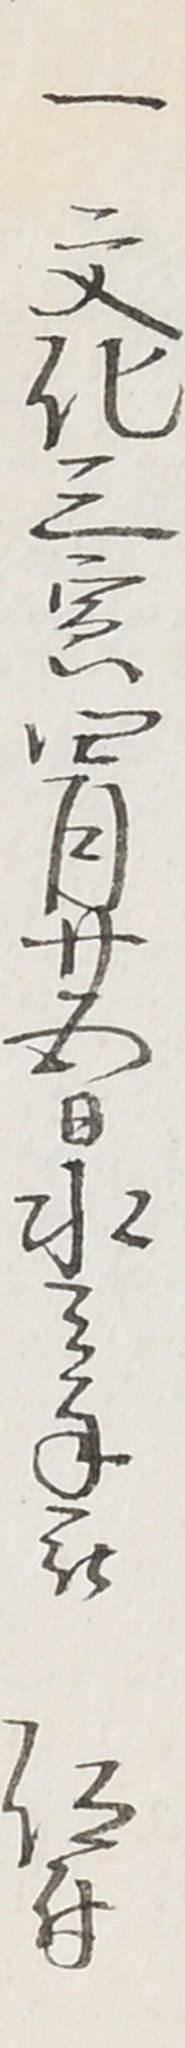一文化三寅四月廿五日水之手被仰付
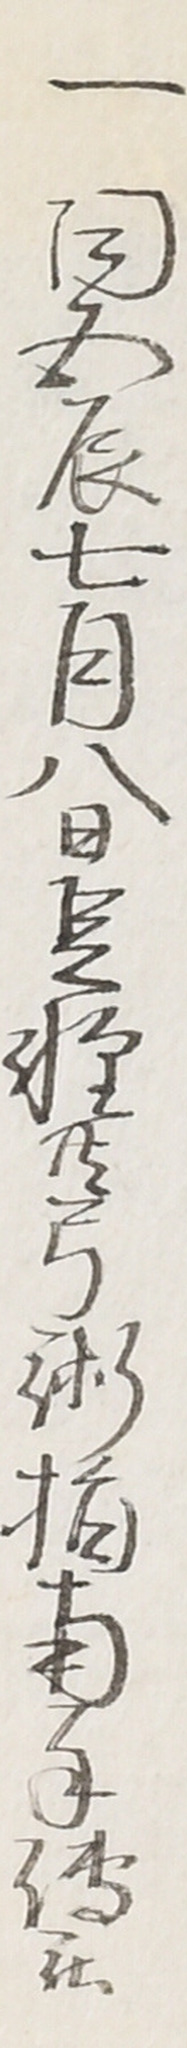一同五辰七月八日足軽共弓術指南手伝被
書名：給人諸士勤仕録（七）
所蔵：伊那市立高遠町図書館・合同会社AMANE
